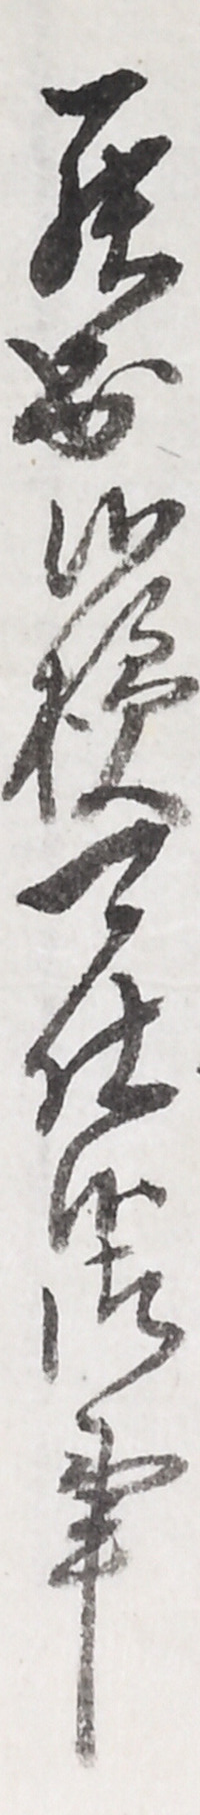罷出候様可仕候御事
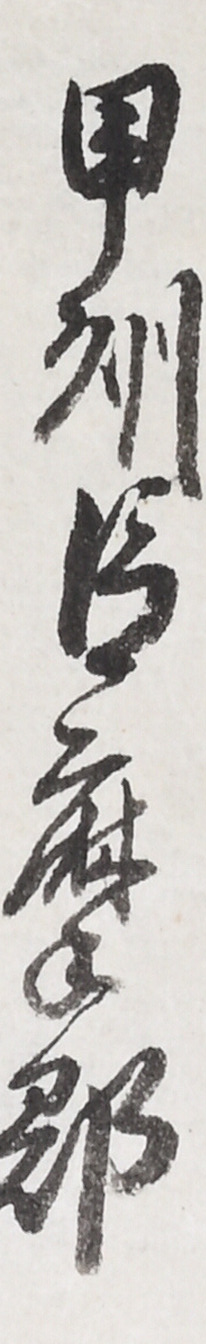甲州巨摩郡
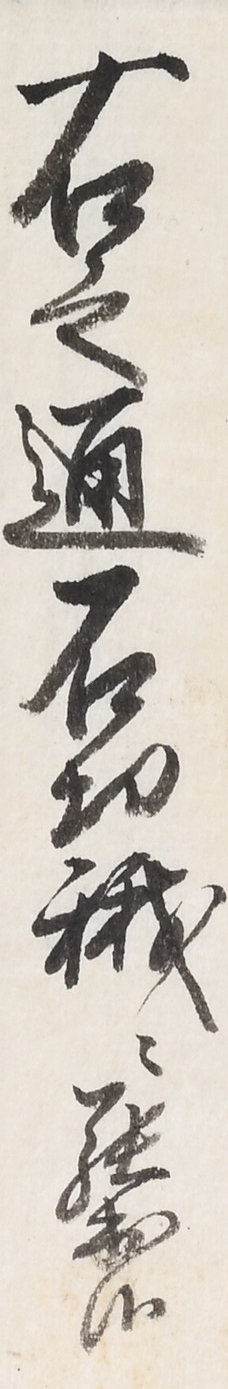右之通石切俄ニ罷出候
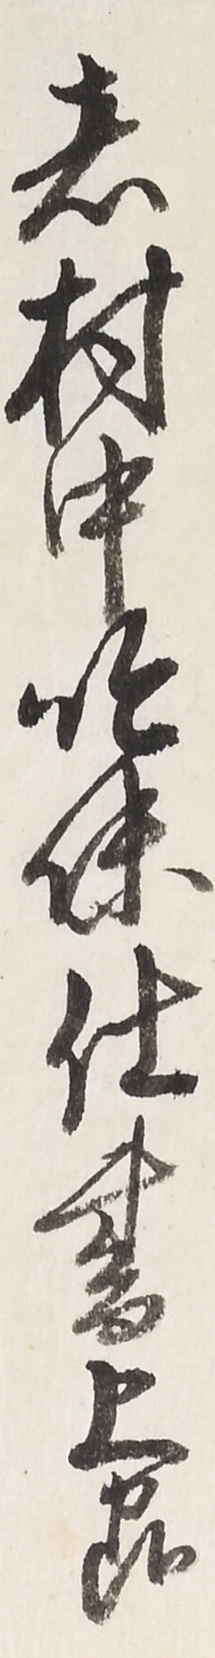者中吟味仕書上申候
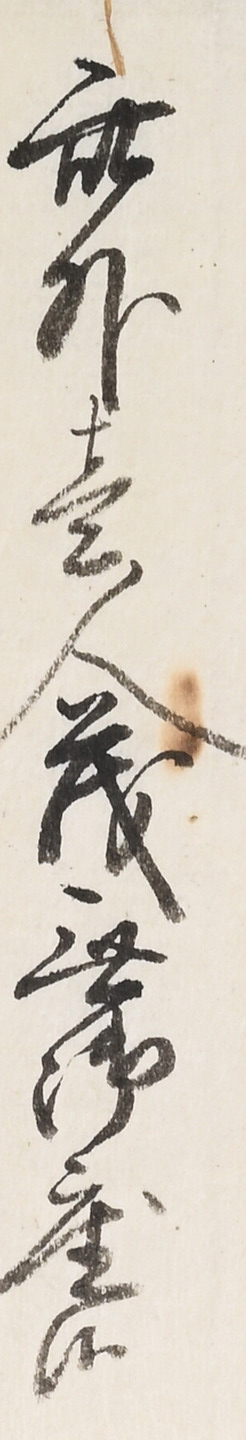此外壱人も無御座候
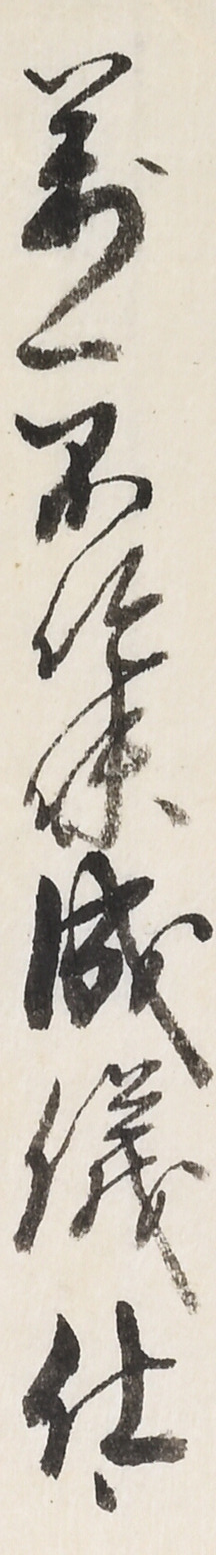万一不吟味成儀仕´
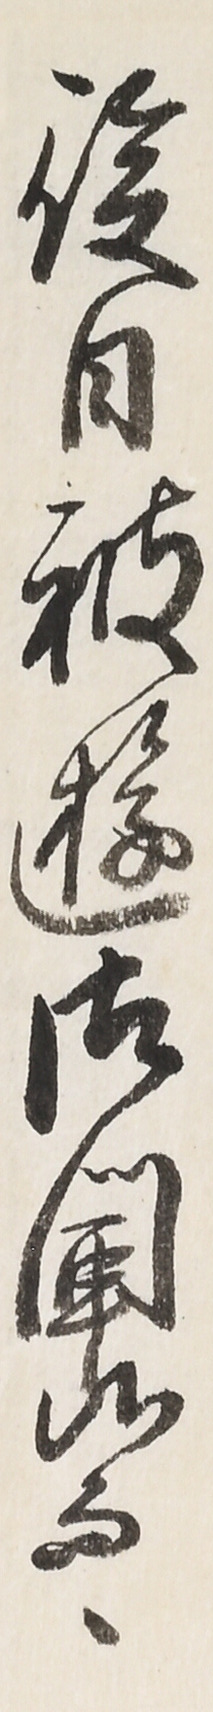後日被遊御聞候而´
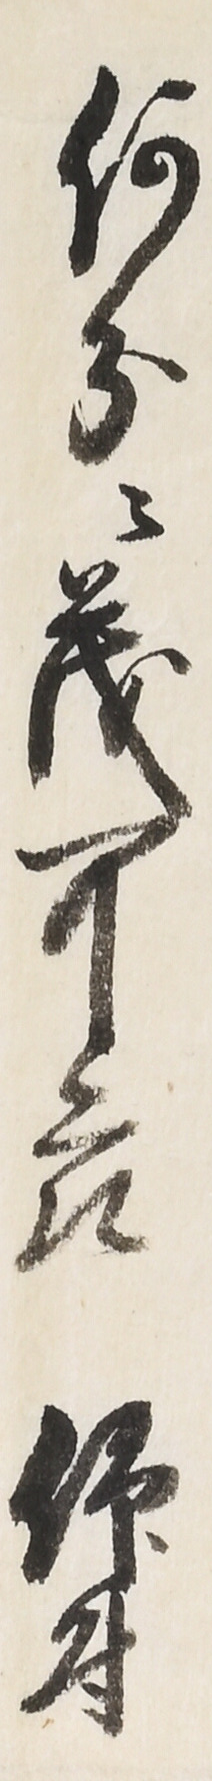何分ニも可被仰付
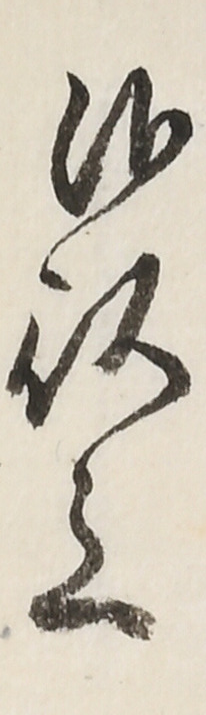候以上
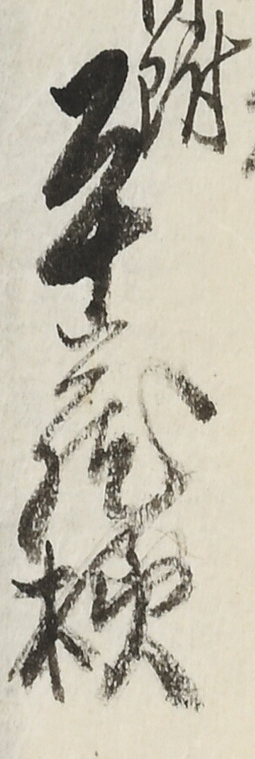平蔵様
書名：安政六己未年正月石切旅稼名前書上帳
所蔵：伊那市立高遠町図書館・合同会社AMANE
